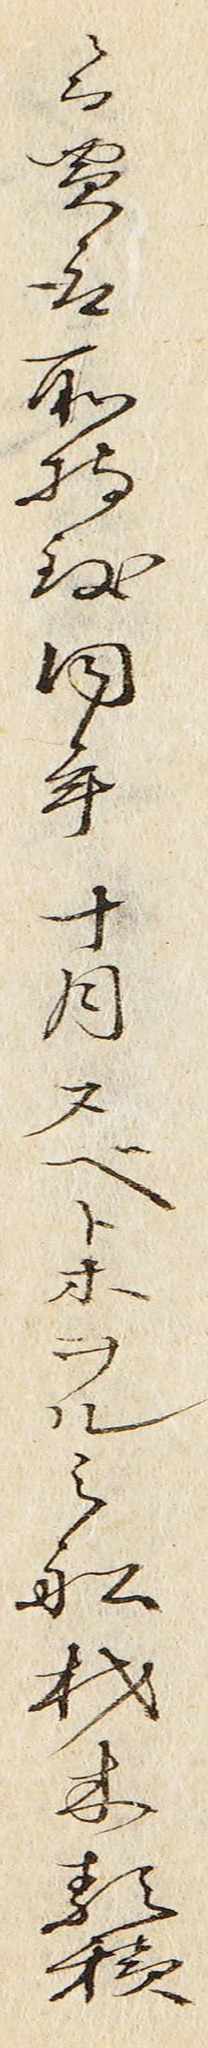に而買取所持致同年十月ヌベトホヲル之船材木類積
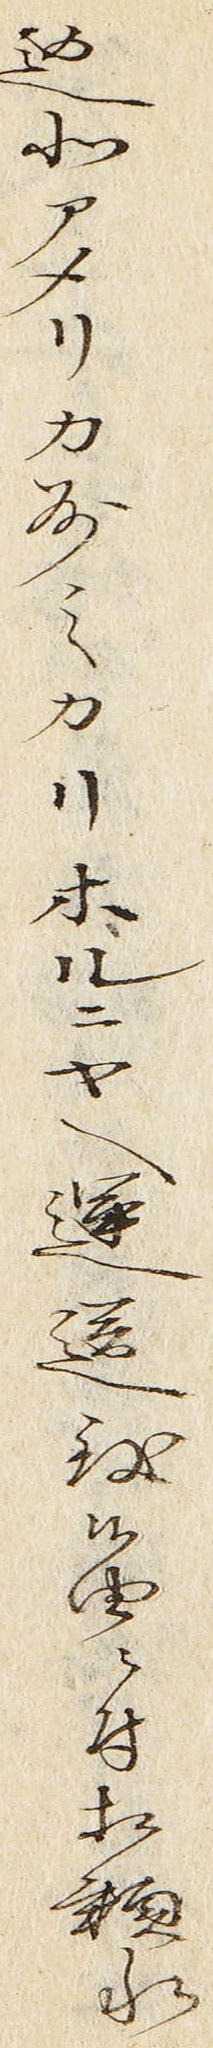込北アメリカ州カリホルニヤへ運送致候由に付相頼水
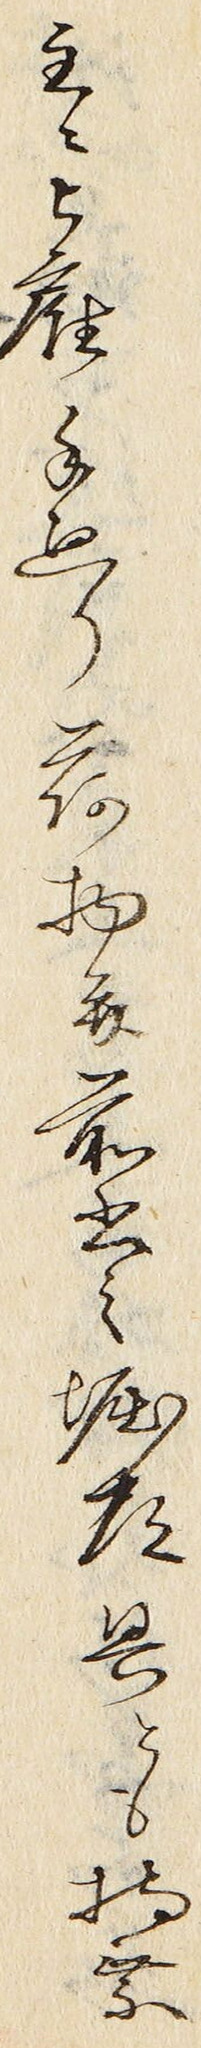主に被雇手廻り荷物并前書之堀道具とも持乗
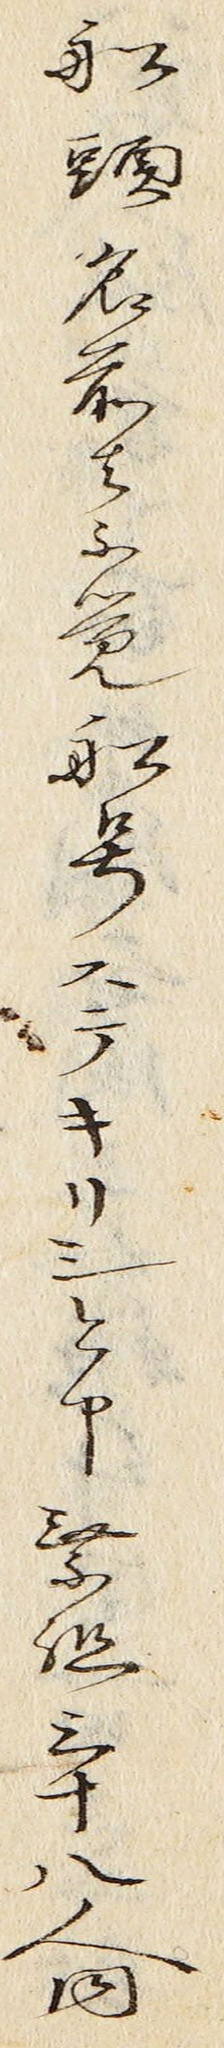船頭名前は不覚船号ステキリシと申乗組三十八人同
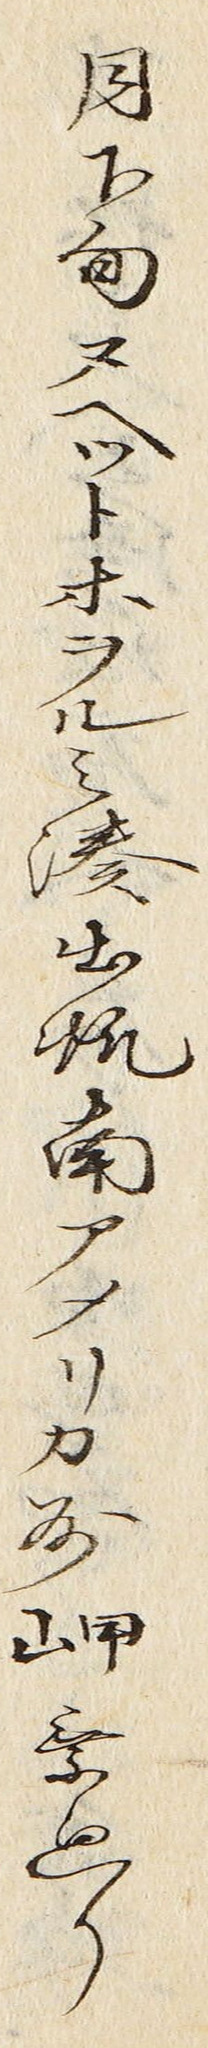月下旬ヌへツトホヲル之湊出帆南アメリカ州岬乗廻り
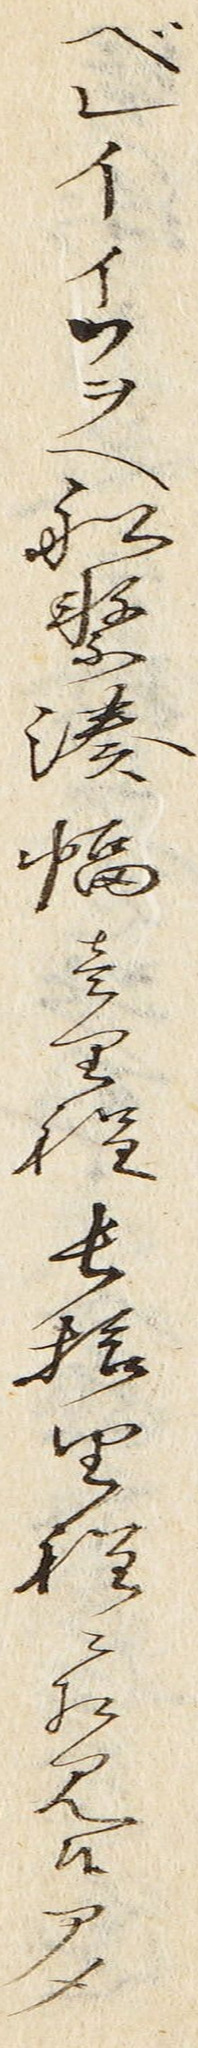ベレイイワヲへ船繋湊幅壱里程長拾里程に相見候アメ
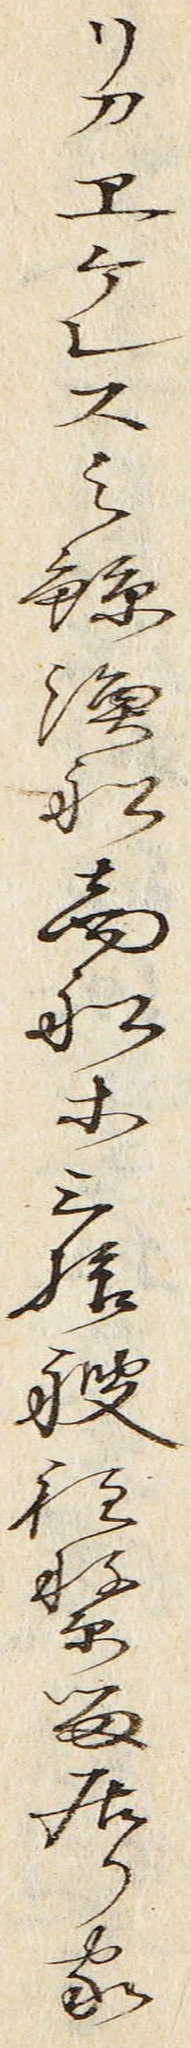リカエケレス之鯨漁船商船等三拾艘程繋留居り家
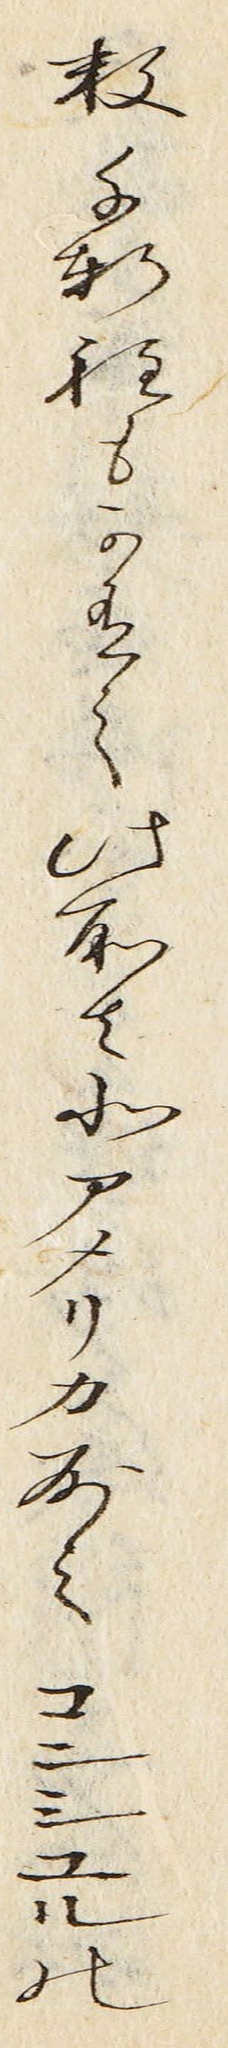数千軒程も可有之此所は北アメリカ州之コンシユルの
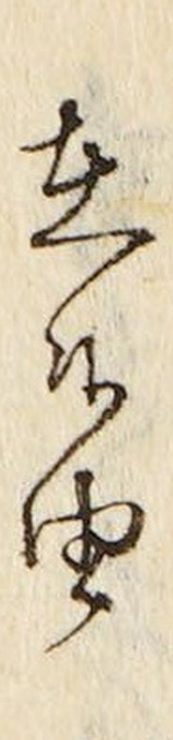在候由
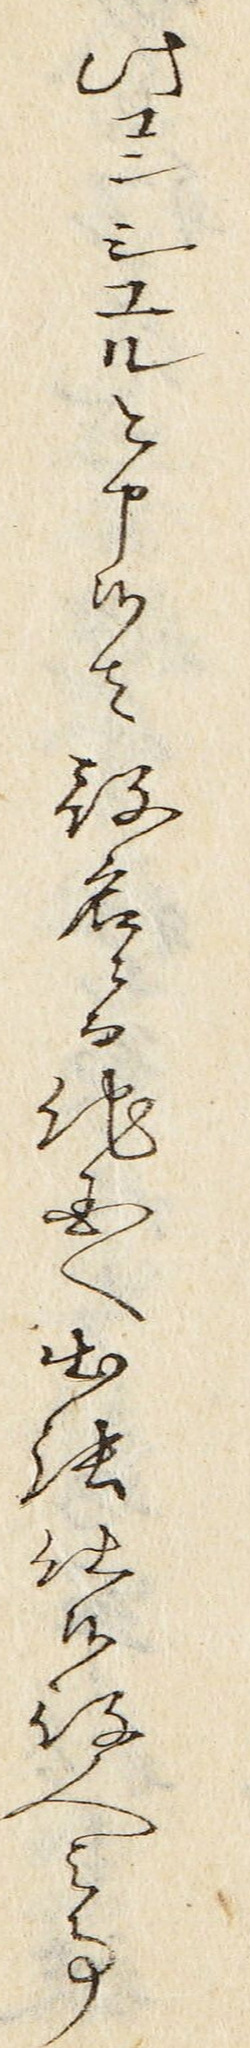此コンシユルと申候は役名に而他国へ出張仕候役人之事
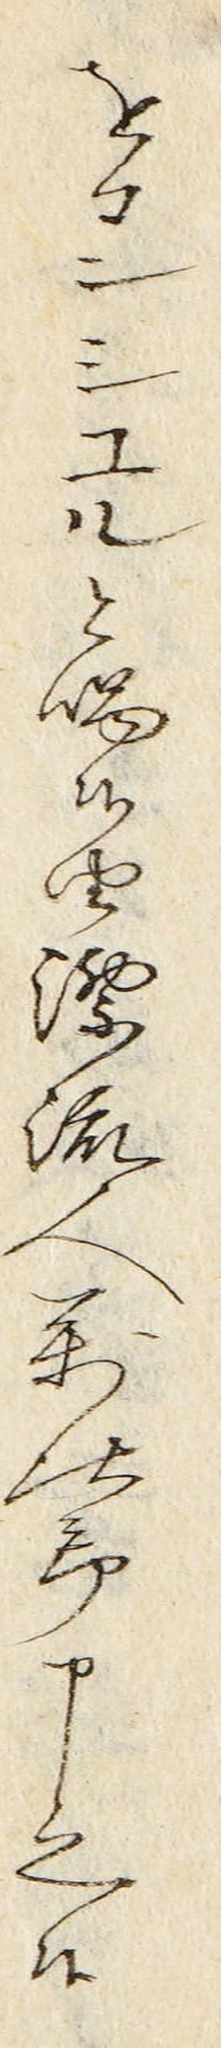をコンシユルと唱候由漂流人万次郎申之候
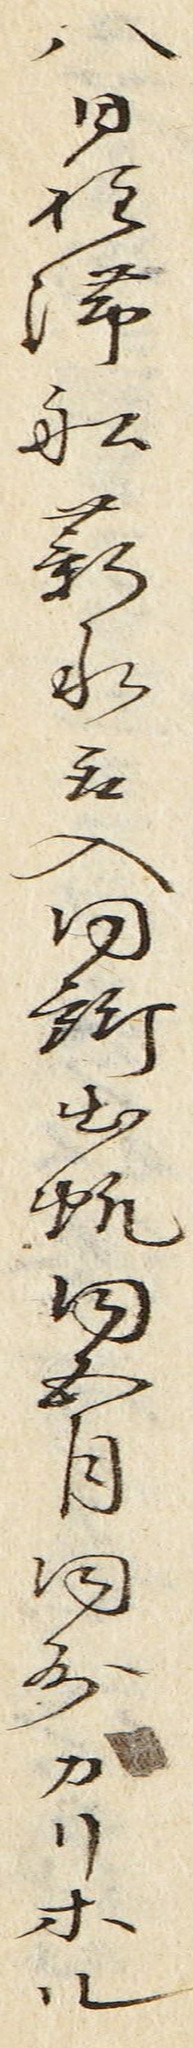八日程滞船薪水取入同所出帆同五月同州カリホル

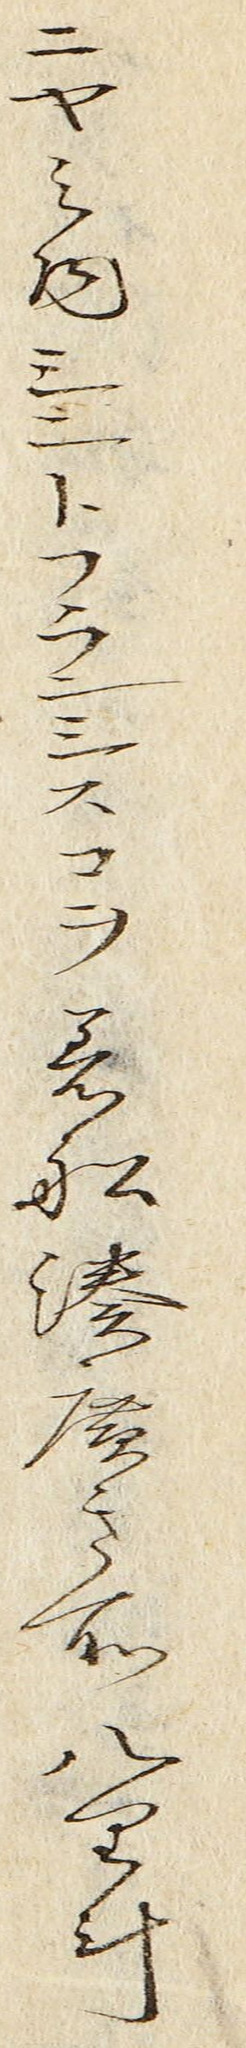ニヤ之内シントフランシスコヲ着船湊広き所八里計
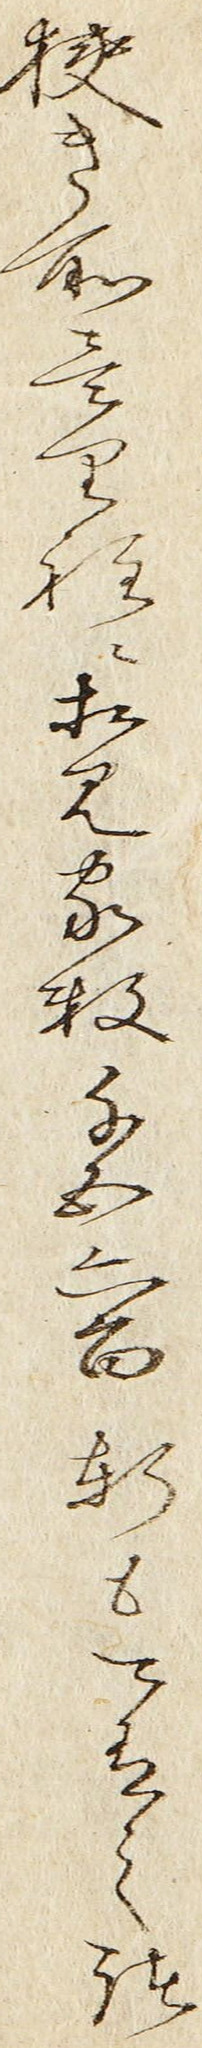狭き所壱里程に相見家数千五六百軒も可有之諸
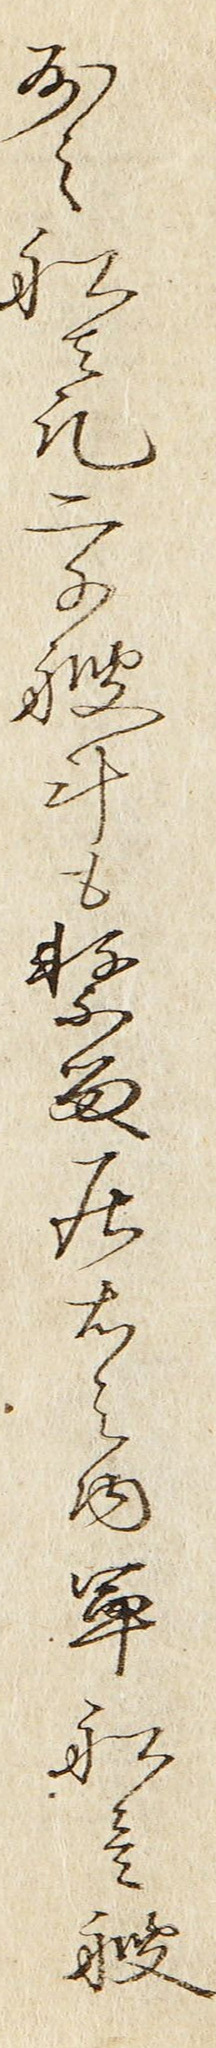州之船は凡二千艘計も繋留居右之内軍船壱艘
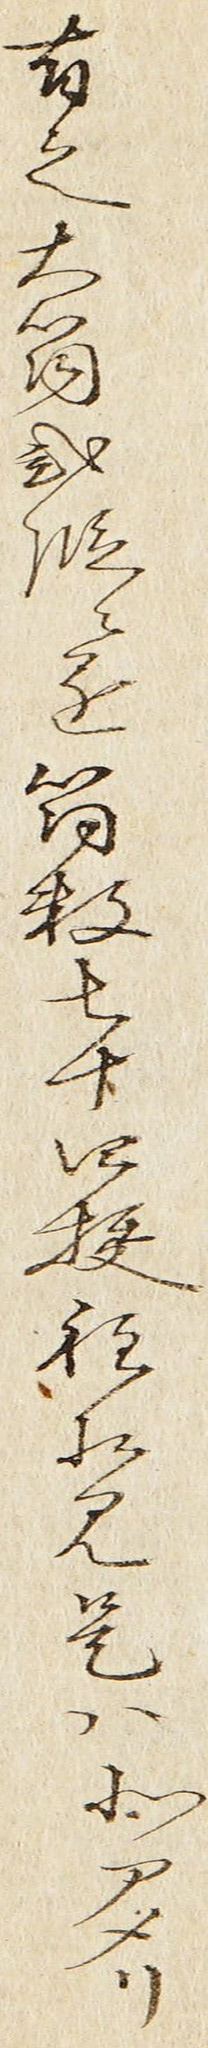有之大筒弐段に懸筒数七十四挺程相見是は北アメリ
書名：土佐中浜万次郎漂流記
